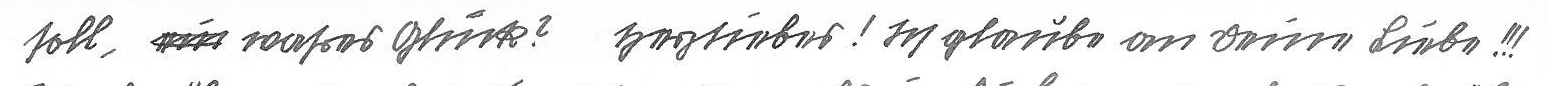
soll, ein wahres Glück? Herzliebes! ich glaube an Deine Liebe!!!
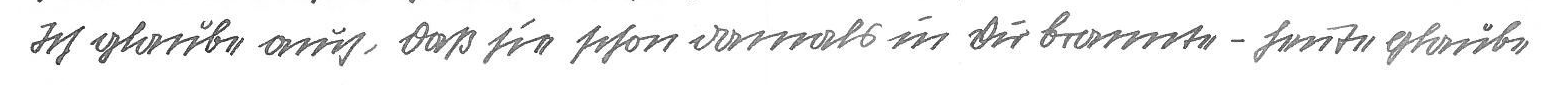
Ich glaube auch, daß sie schon damals in Dir brannte – heute glaube
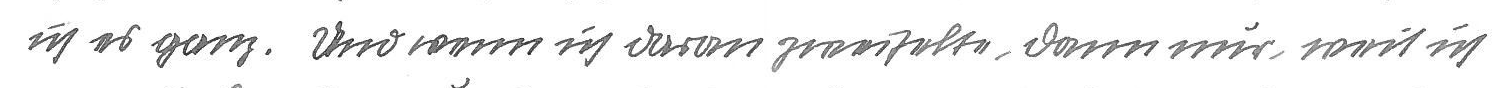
ich es ganz. Und wenn ich daran zweifelte, dann nur, weil ich
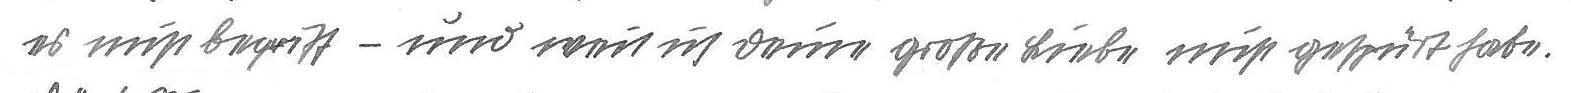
es nicht begriff – und weil ich Deine große Liebe nicht gespürt habe.
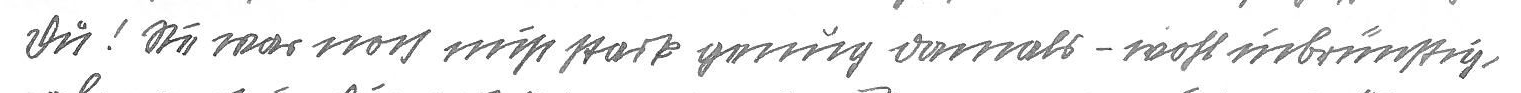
Du! Sie war noch nicht stark genug damals – wohl inbrünstig,
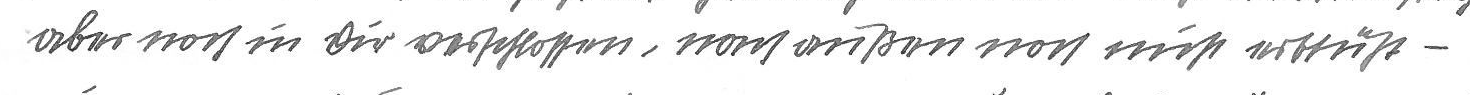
aber noch in Dir verschlossen, nach außen noch nicht erblüht –
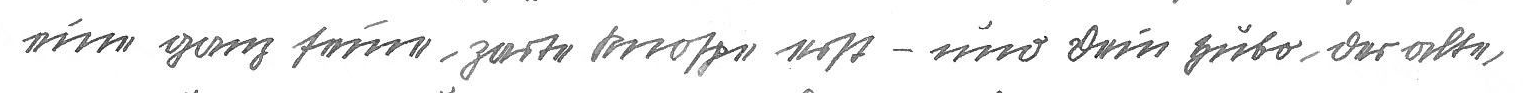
eine ganz feine, zarte Knospe erst – und Dein Hubo, der alte,
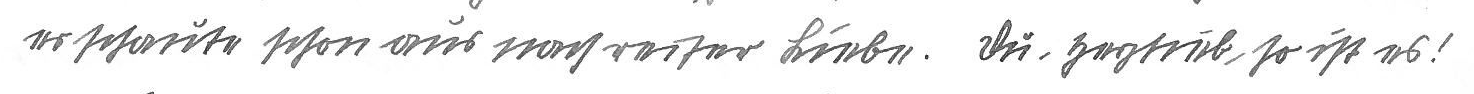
er schaute schon aus nach reifer Liebe. Du, Herzlieb, so ist es!
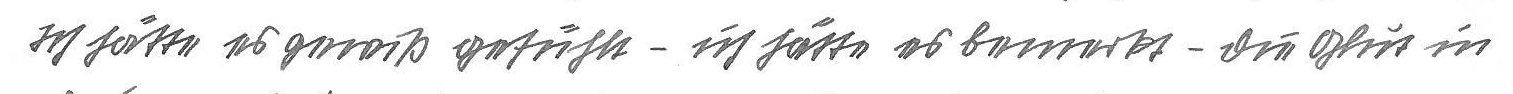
Ich hätte es gewiß gefühlt – ich hätte es bemerkt – die Glut in
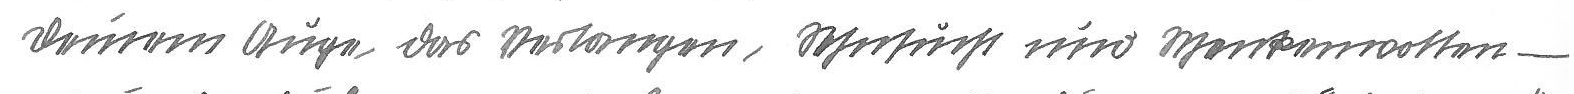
Deinen Augen, das Verlangen, Sehnsucht und Schenkenwollen –
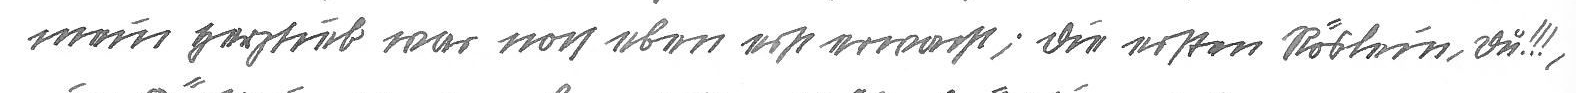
mein Herzlieb war noch eben erst erwacht; die ersten Röslein, Du!!! ,
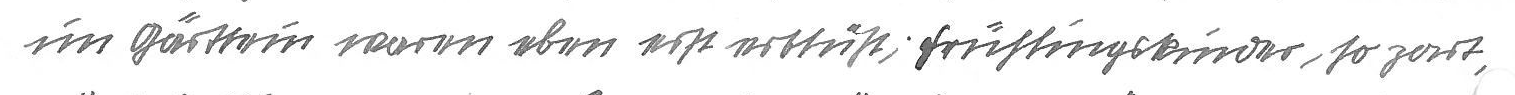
im Gärtlein waren eben erst erblüht; Frühlingskinder, so zart,
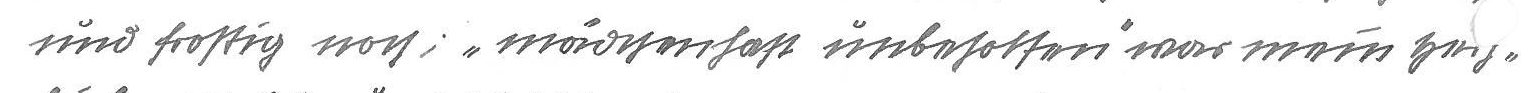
und frostig noch; „mädchenhaft unbeholfen” war mein Herz¬
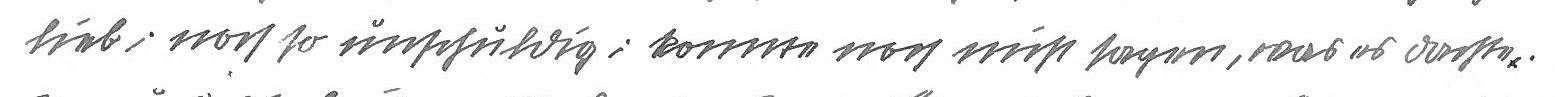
lieb; noch so unschuldig; konnte noch nicht sagen, was es dachte.
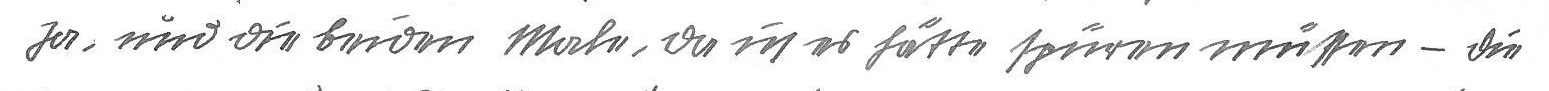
Ja, und die beiden Male, da ich es hätte spüren müssen – die
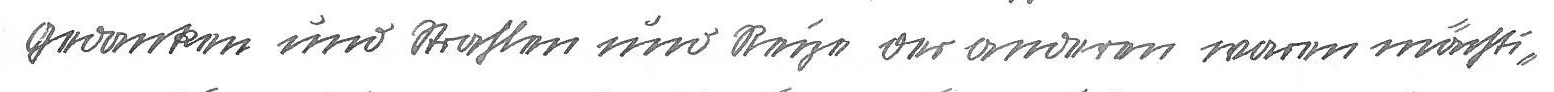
Gedanken und Strahlen und Reize der anderen waren mächti¬
